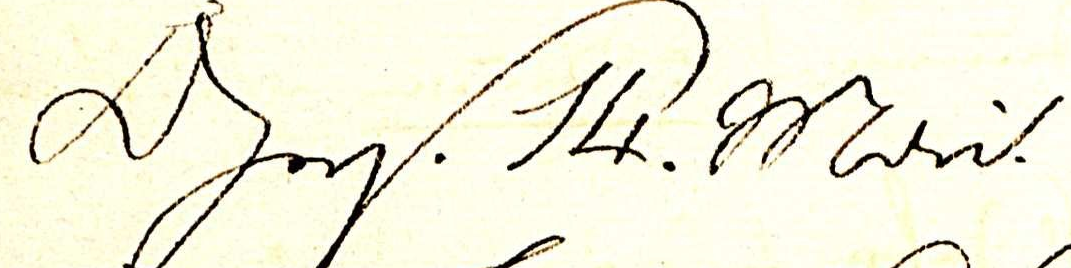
Ges. 14. Mai
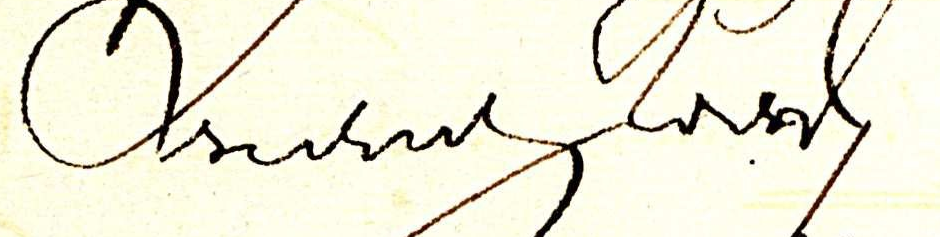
Franz Karl
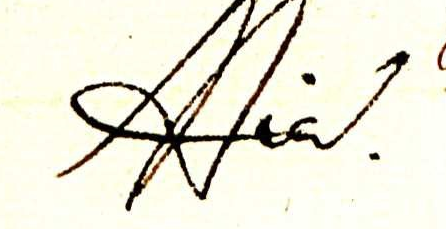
[Min?]
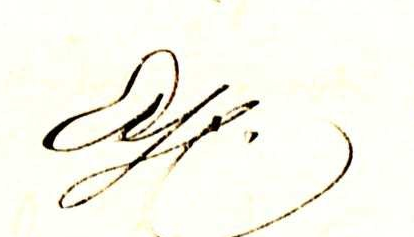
AhE
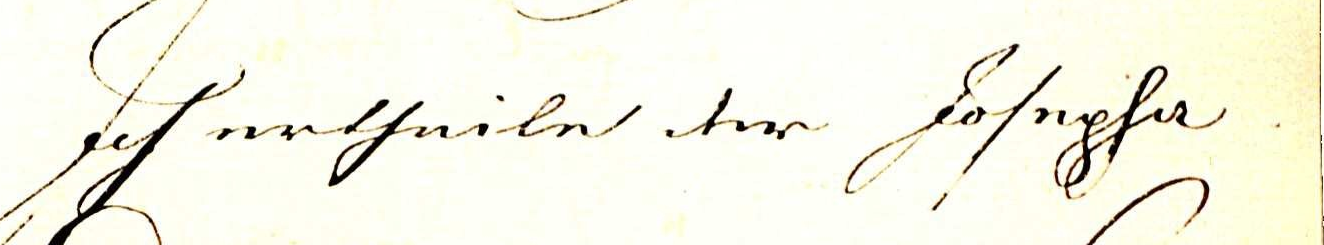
Ich ertheile der Josepha
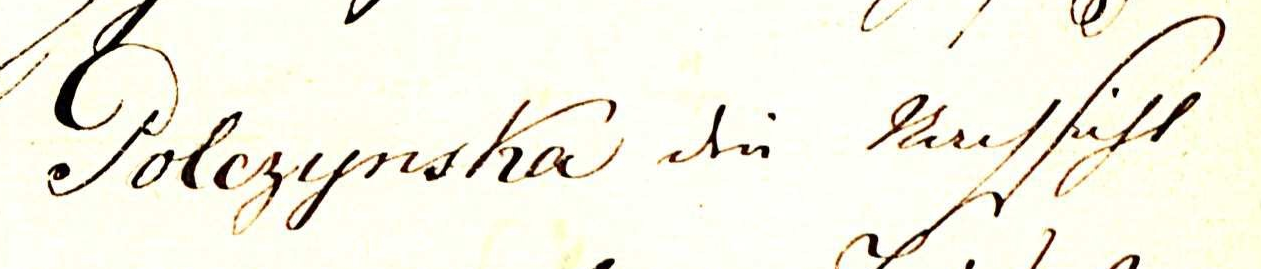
Polczynska die Nachsicht
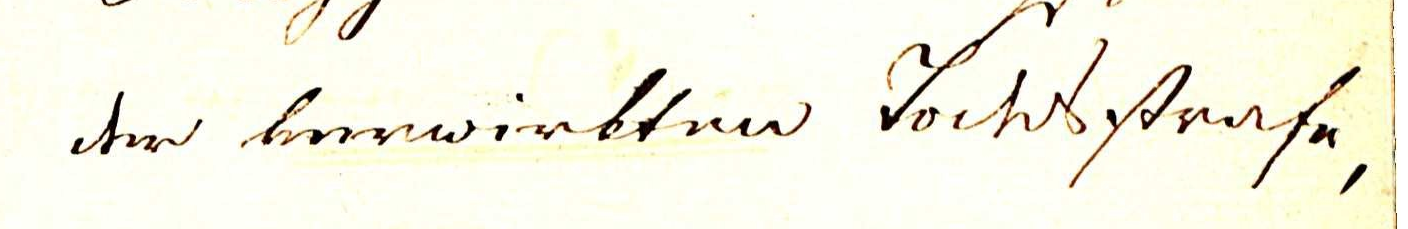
der verwirkten Todesstrafe,
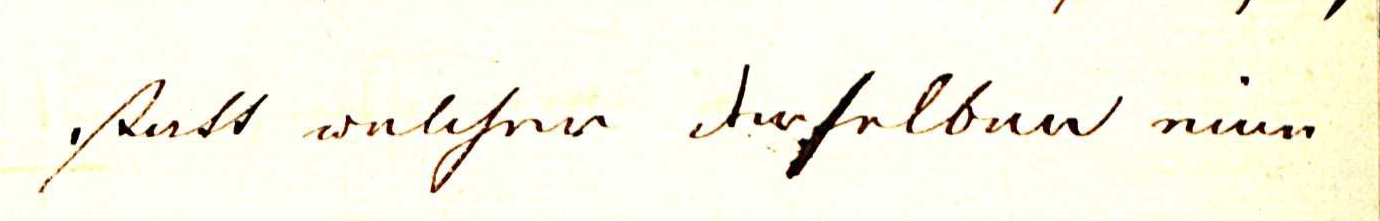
statt welcher derselben eine
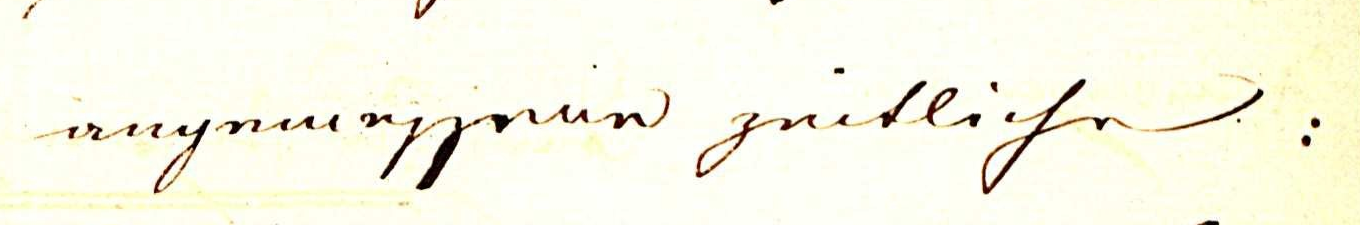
angemessene zeitliche
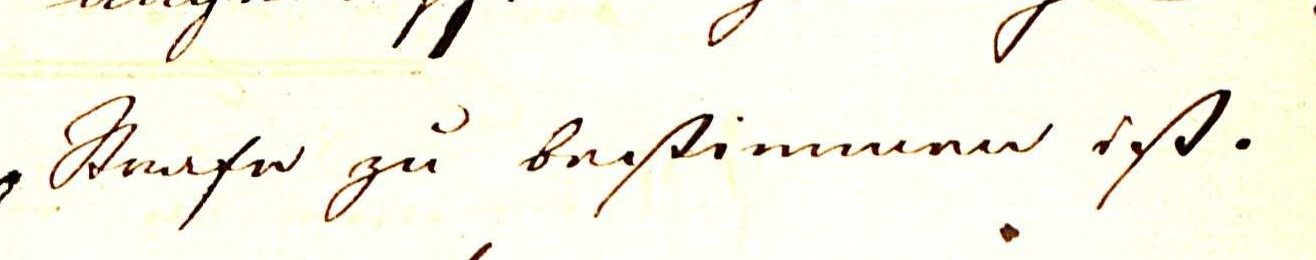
Strafe zu bestimmen ist.
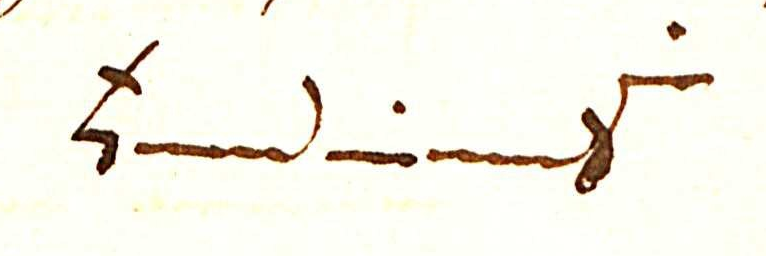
Ferdinand
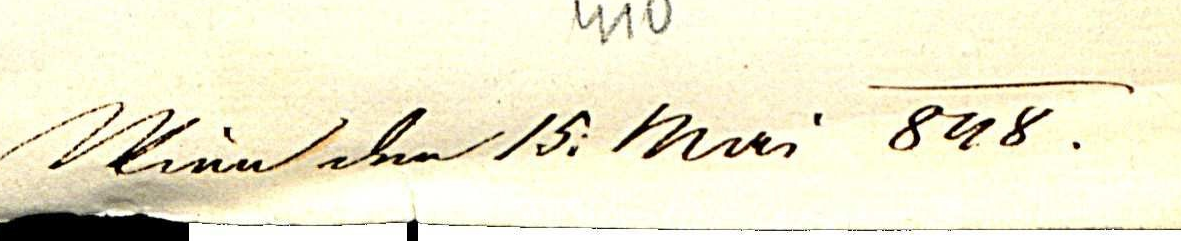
Wien 15. Mai 1848.
